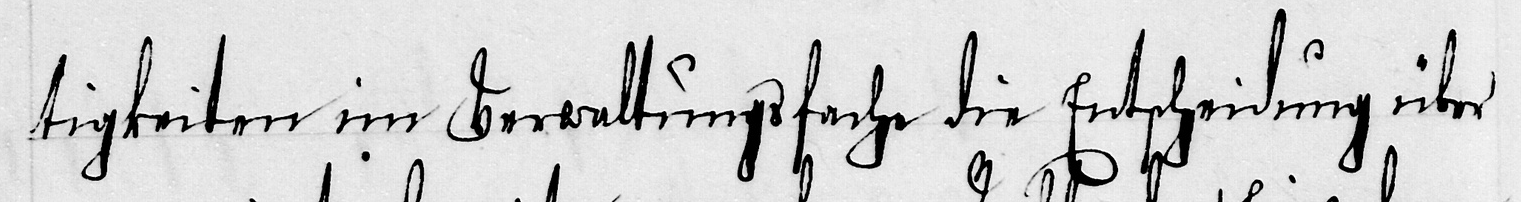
tigkeiten im Verwaltungsfache die Entscheidung über
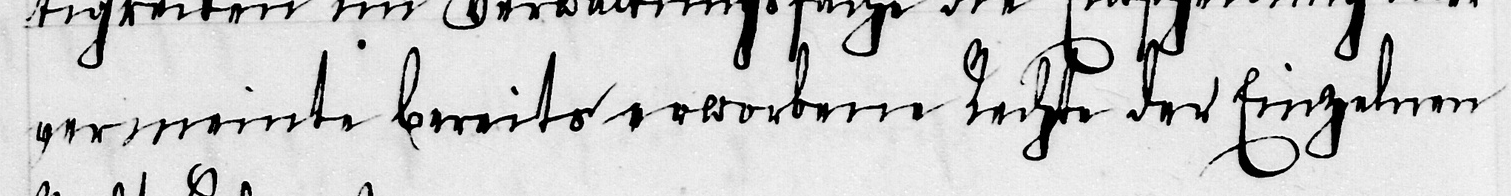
vermeinte bereits erworbene Rechte der Einzelnen
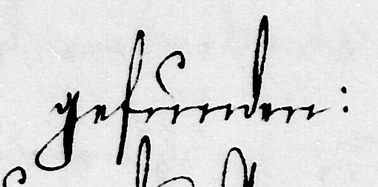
gefunden:
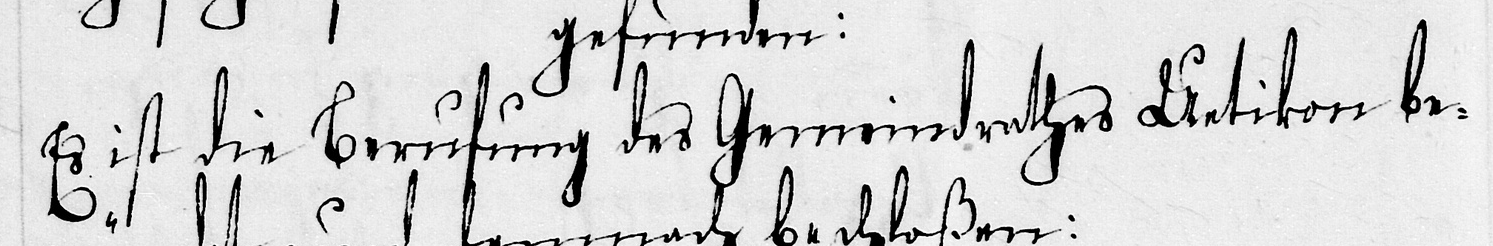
Es ist die Berufung des Gemeindrathes Uetikon be¬
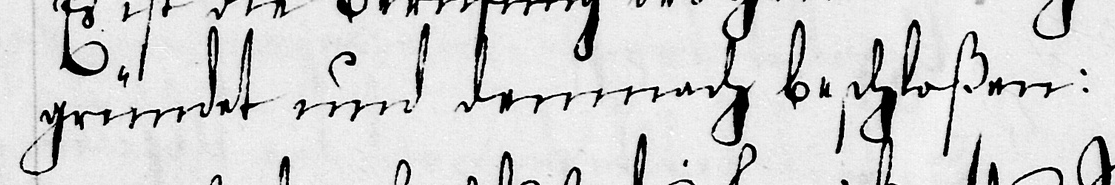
gründet und demnach beschloßen:
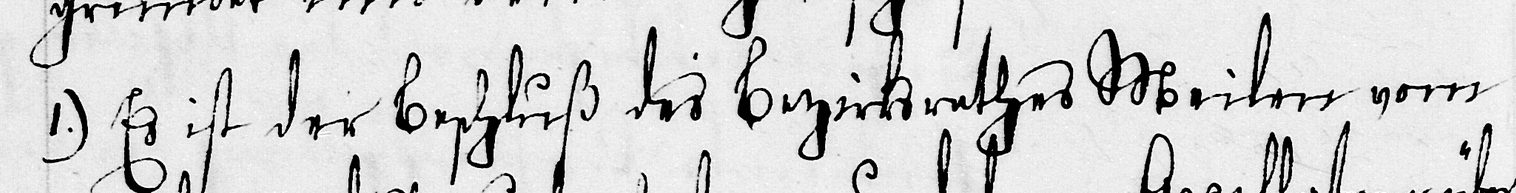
1.) Es ist der Beschluß des Bezirksrathes Meilen vom
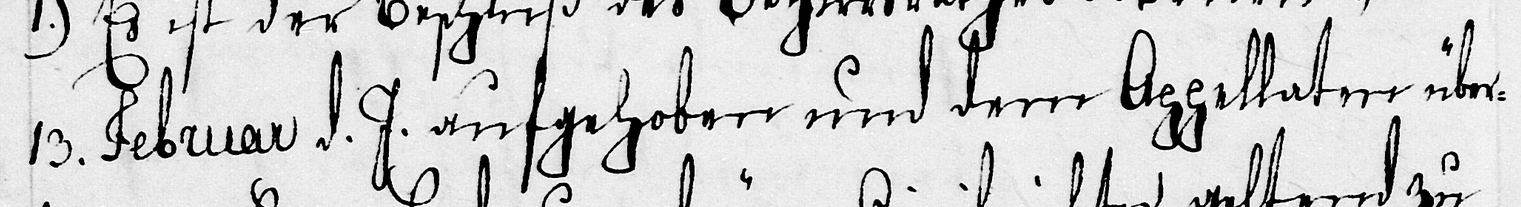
13. Februar d. J. aufgehoben und dem Appellaten übe¬
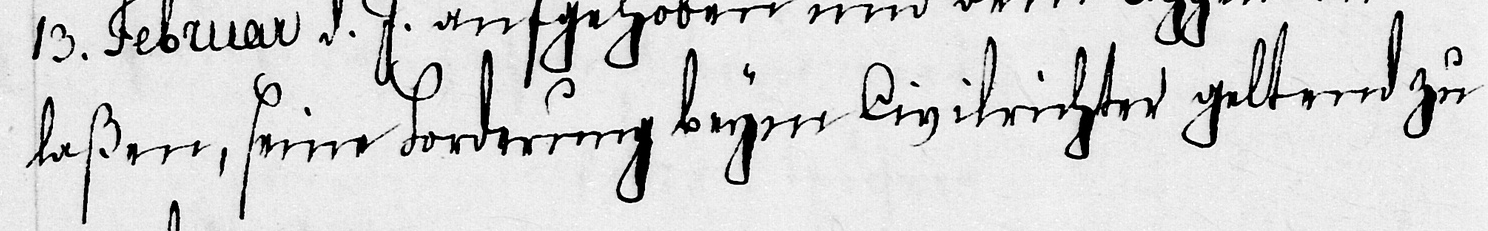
rlaßen, seine Forderung beym Civilrichter geltend zu
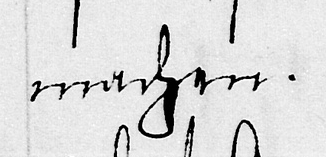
machen.
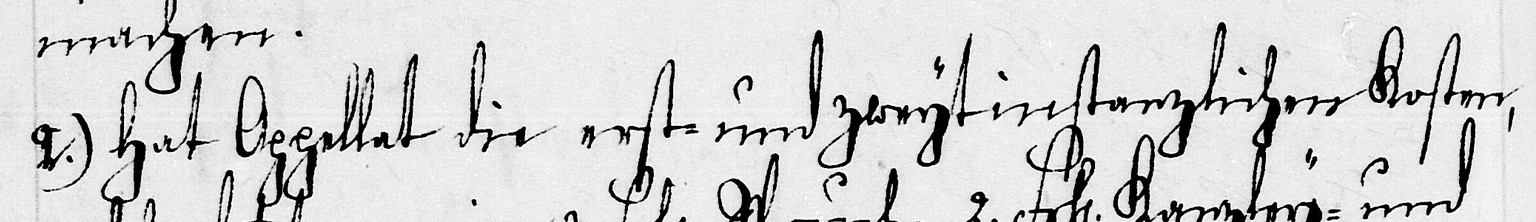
2.) Hat Appellat die erst- und zweytinstanzlichen Kosten,
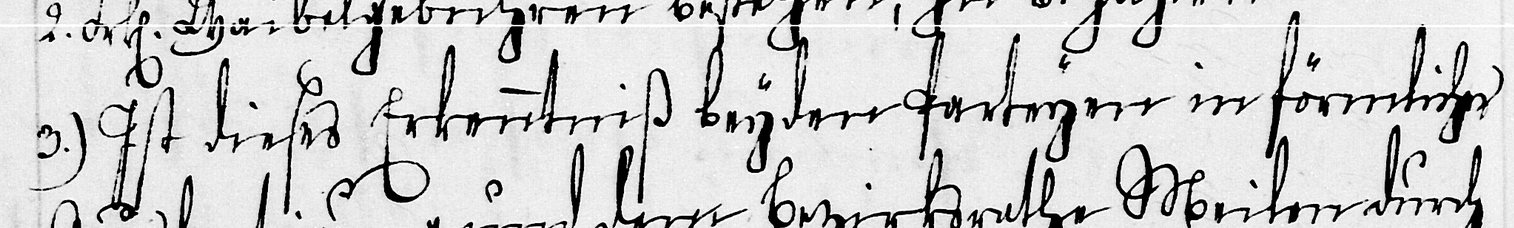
3.) Ist dieses Erkenntniß beyden Parteyen in förmlicher
